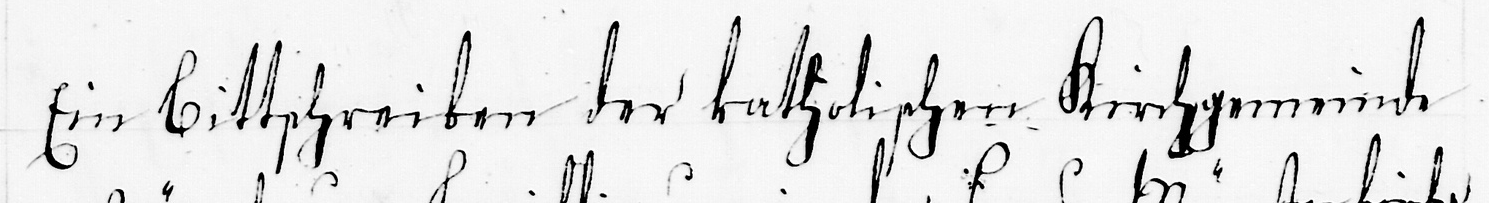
Ein Bittschreiben der katholischen Kirchgemeinde
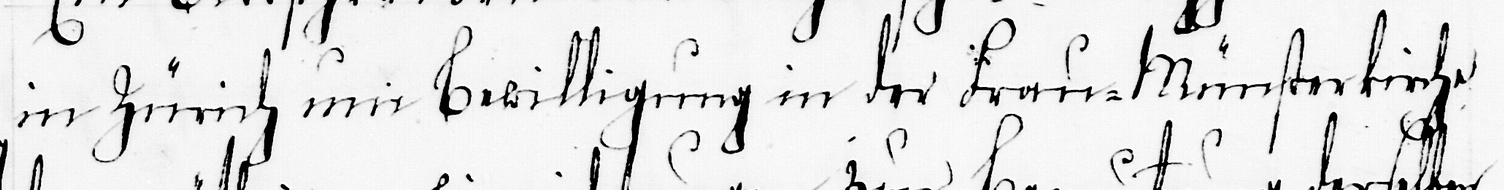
in Zürich um Bewilligung in der Frau-Münsterkirche
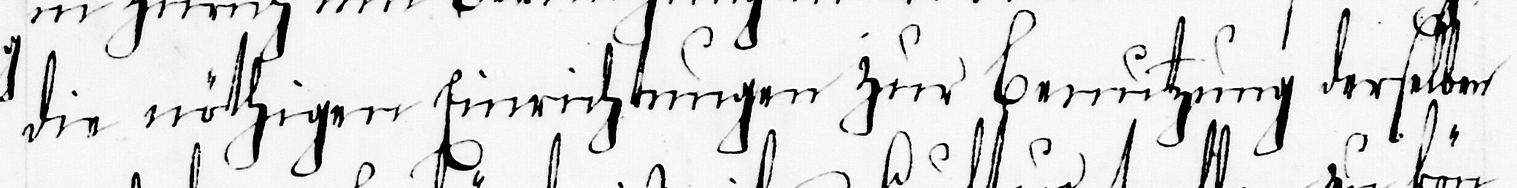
die nöthigen Einrichtungen zur Benutzung derselben
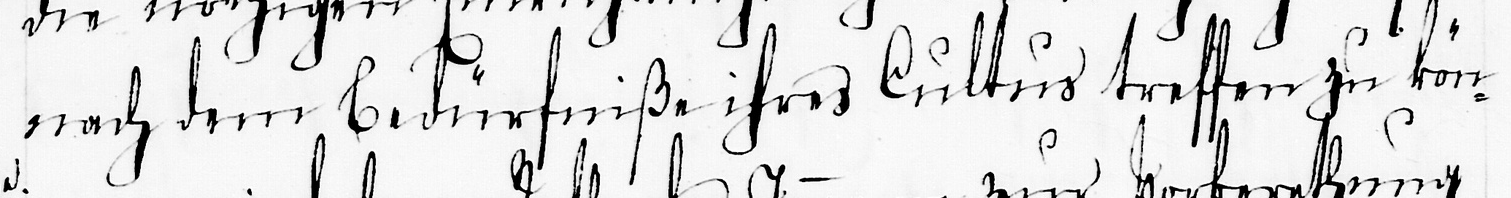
nach dem Bedürfniße ihres Cultus treffen zu kön¬
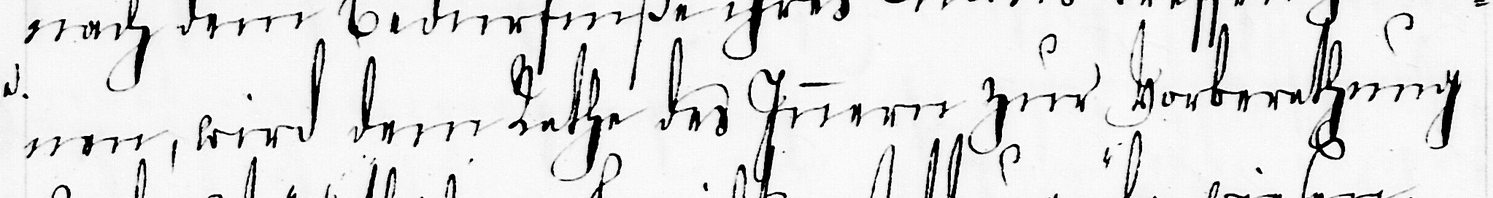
nen, wird dem Rathe des Innern zur Vorberathung
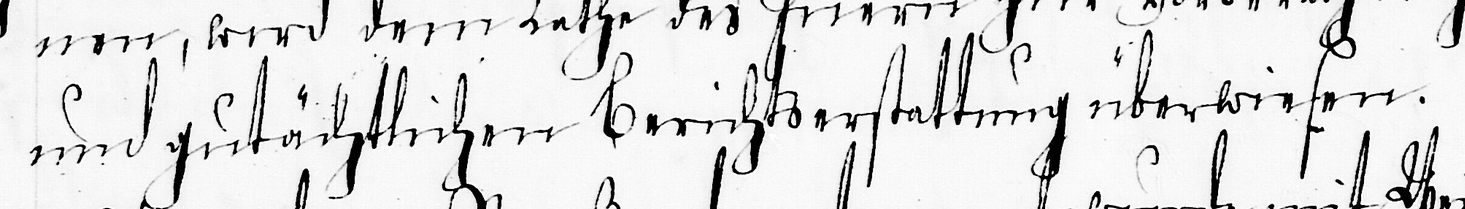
und gutächtlichen Berichtserstattung überwiesen.
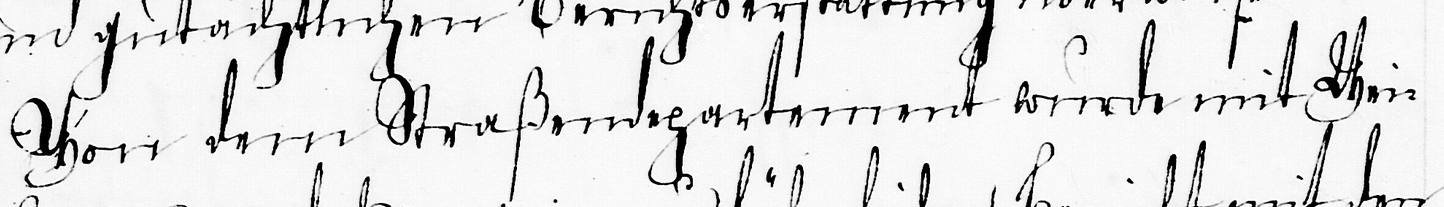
Von dem Straßendepartement wurde mit Wei¬
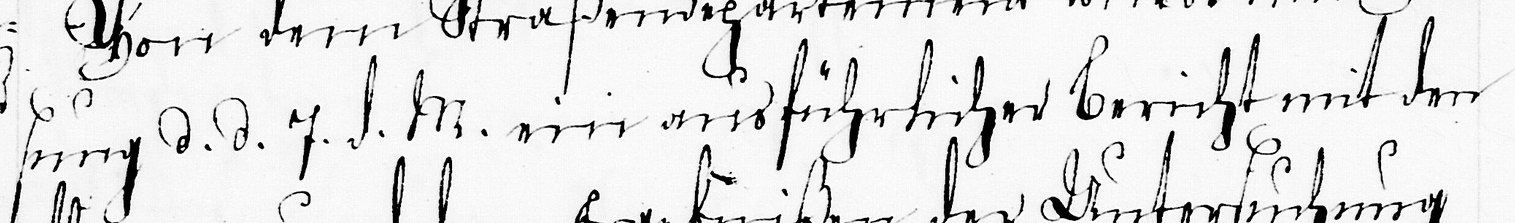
sung d. d. 7. d. M. ein ausführlicher Bericht mit den
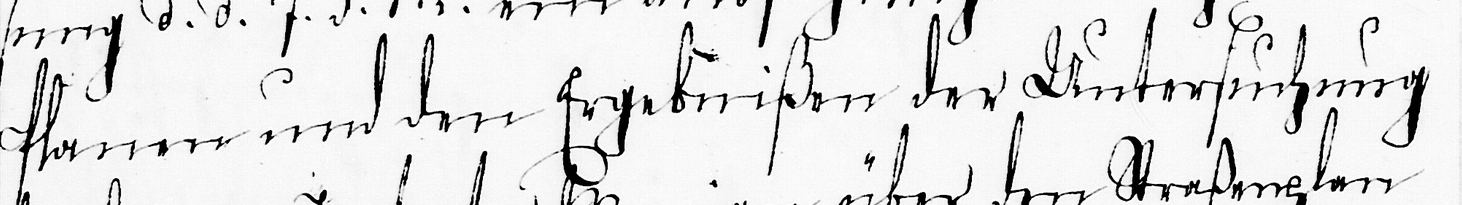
Planen und den Ergebnißen der Untersuchung
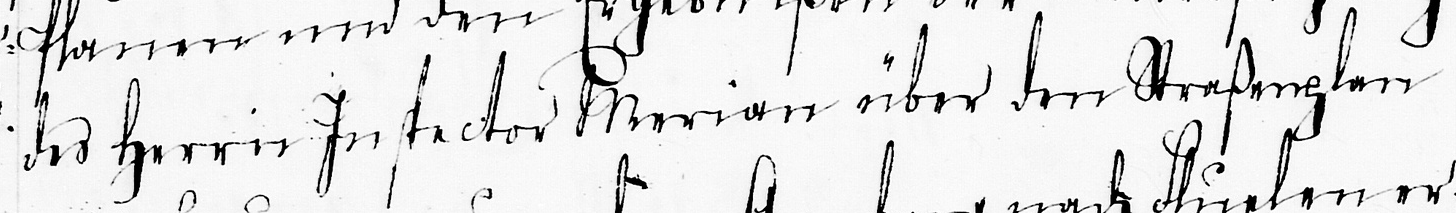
des Herrn Inspector Merian über den Straßenplan
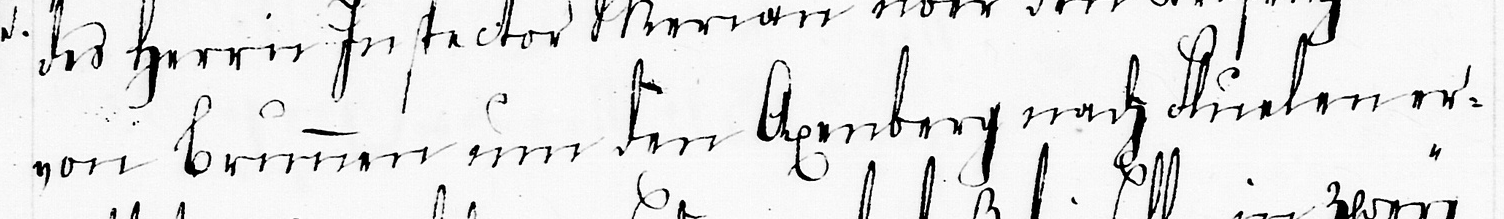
von Brunnen um den Axenberg nach Fluelen ers¬
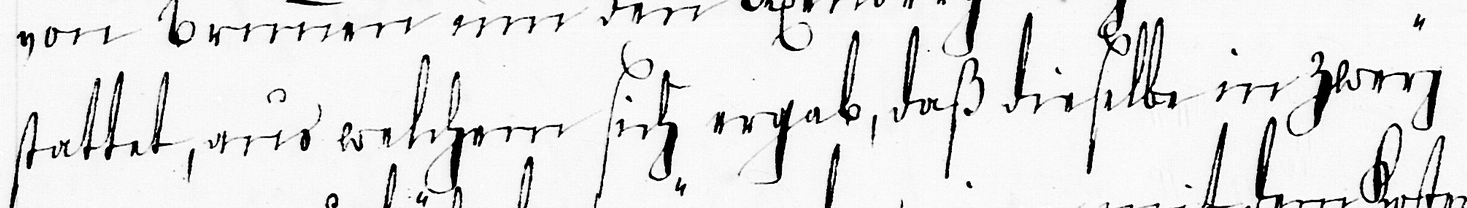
tattet, aus welchem sich ergab, daß dieselbe in zwey
